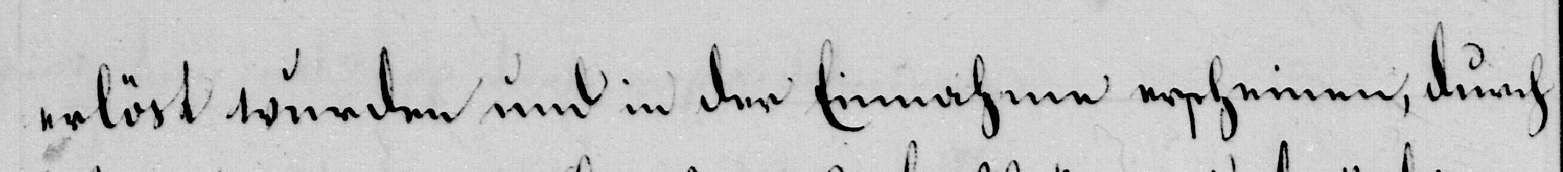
erlöst wurden und in der Einnahme erscheinen, durch
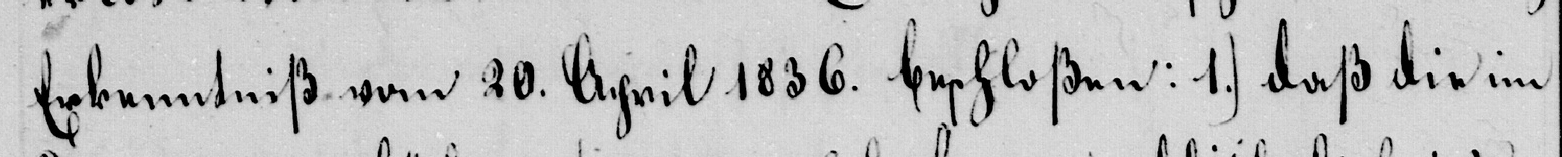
Erkenntniß vom 20. April 1836. beschloßen: 1.) daß die im
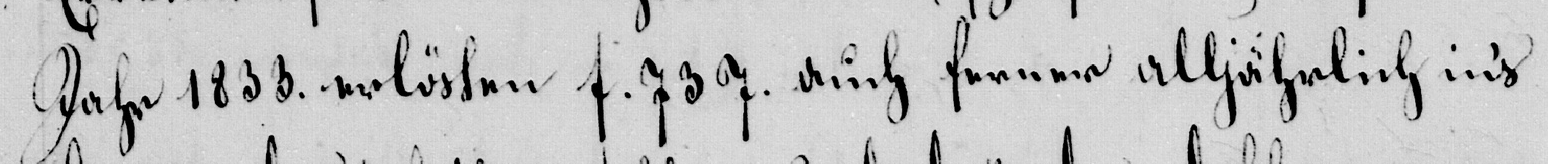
Jahr 1833. erlösten f. 737. auch ferner alljährlich in’s
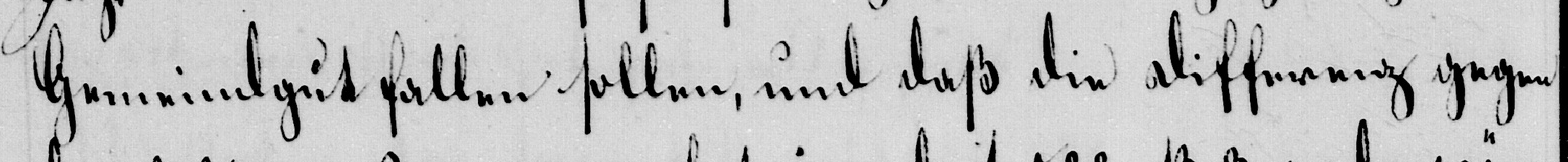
Gemeindgut fallen sollen, und daß die Differenz gegen
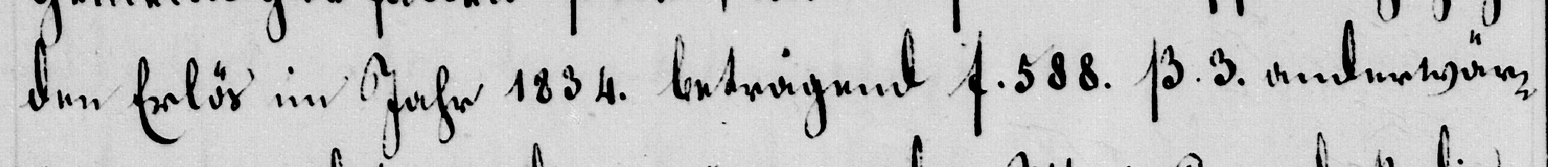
den Erlös im Jahr 1834. betragend f. 588. ß. 3. anderwär¬
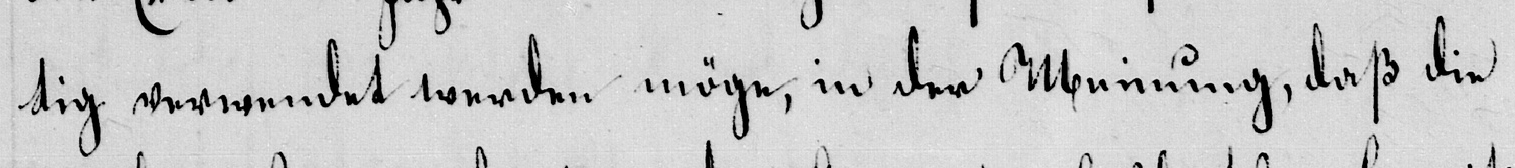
tig verwendet werden möge, in der Meinung, daß die
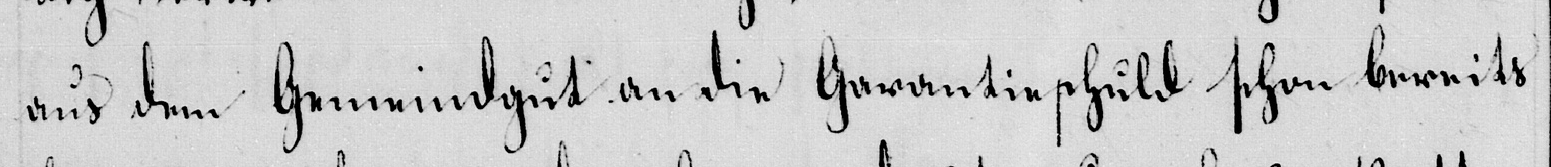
aus dem Gemeindgut an die Garantieschuld schon bereits
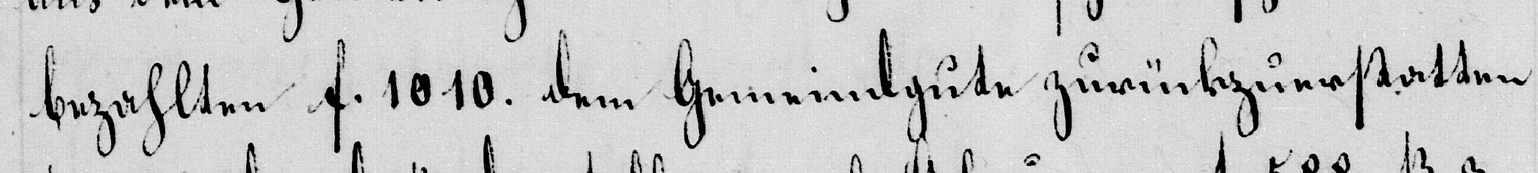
bezahlten f. 1010 dem Gemeindgute zurückzuerstatten
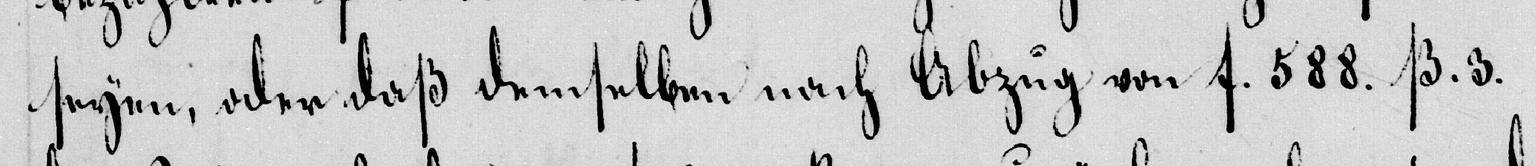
seyen, oder daß demselben nach Abzug von f. 588. ß. 3.
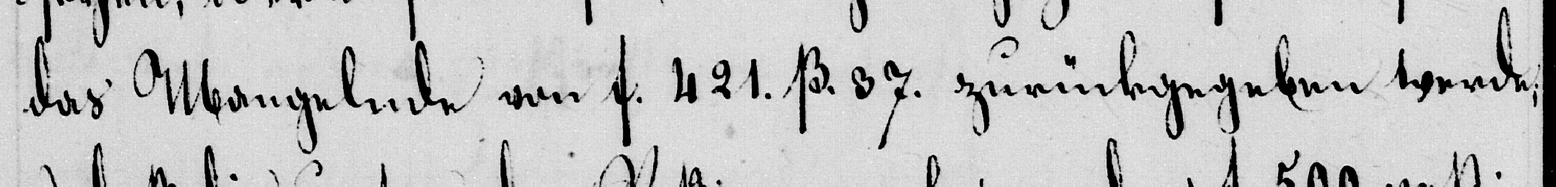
das Mangelnde von f. 421. ß. 37. zurückgegeben werde;
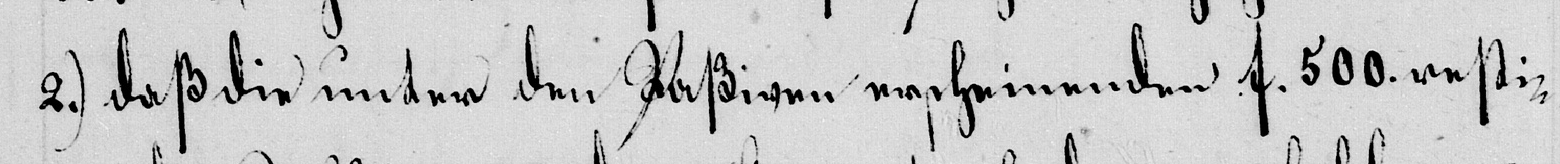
2.) daß die unter den Paßiven erscheinenden f. 500. resti¬
